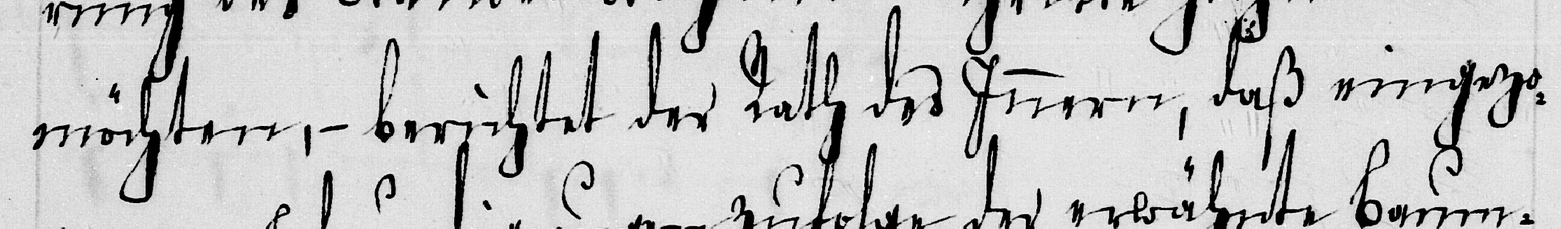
möchten, – berichtet der Rath des Innern, daß eingezo¬
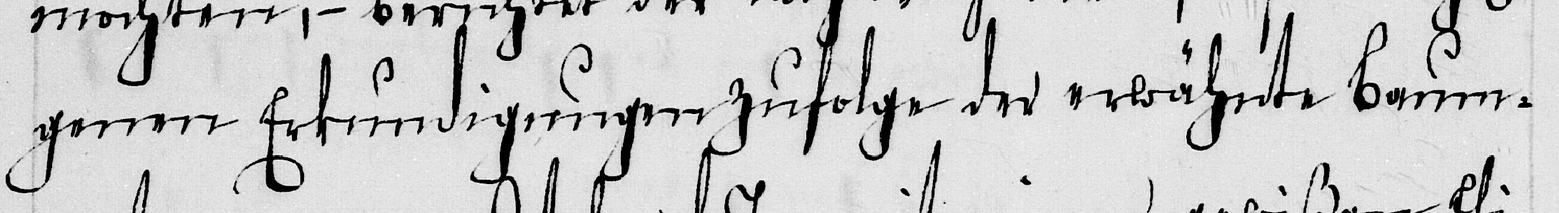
genen Erkundigungen zufolge der erwähnte Baum¬
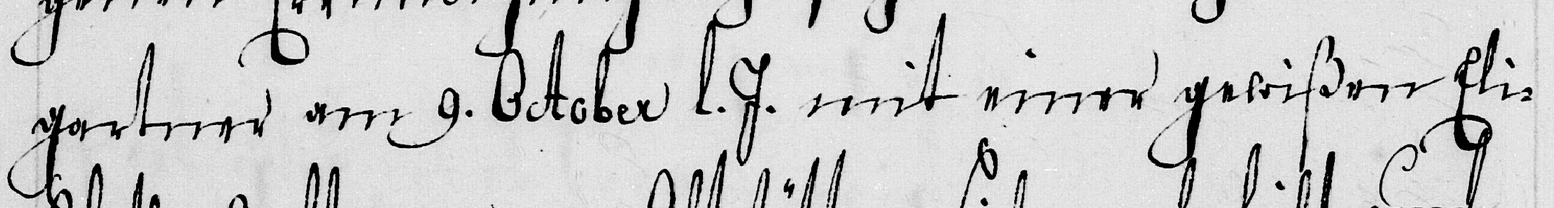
gartner am 9. October l. J. mit einer gewißen Eli¬
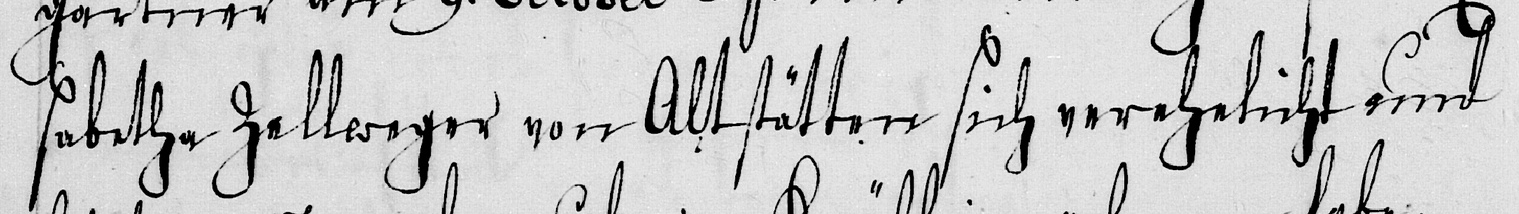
sabetha Zellweger von Altstätten sich verehelicht und
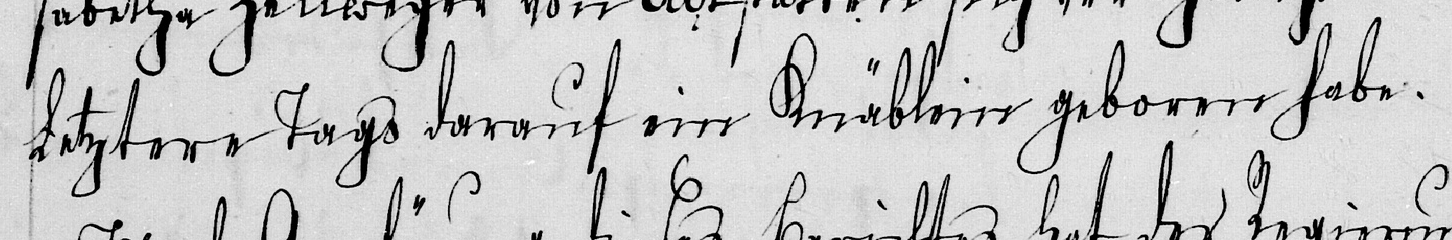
Letztere Tags darauf ein Knäblein geboren habe.
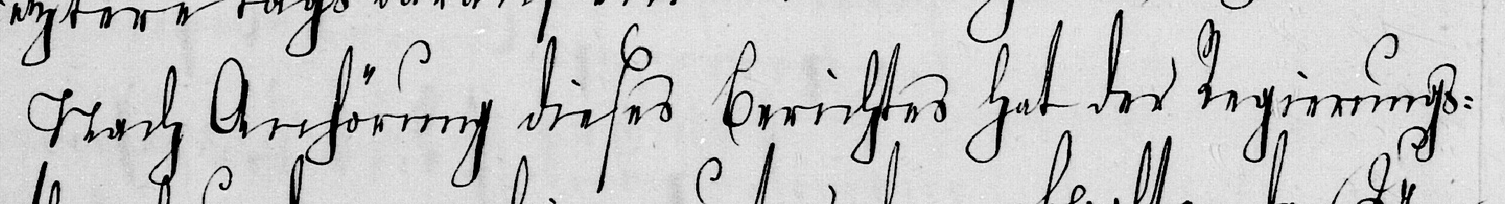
Nach Anhörung dieses Berichtes hat der Regierungs¬
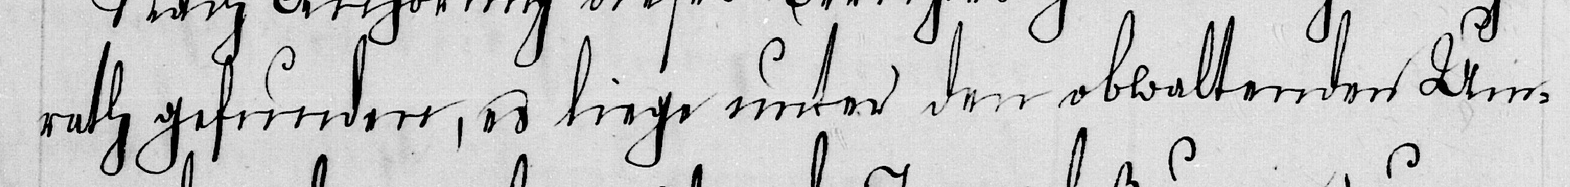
rath gefunden, es liege unter den obwaltenden Um¬
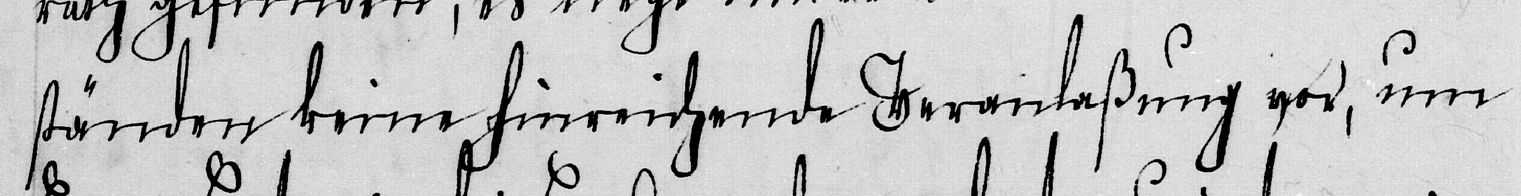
ständen keine hinreichende Veranlaßung vor, um
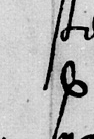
S¬
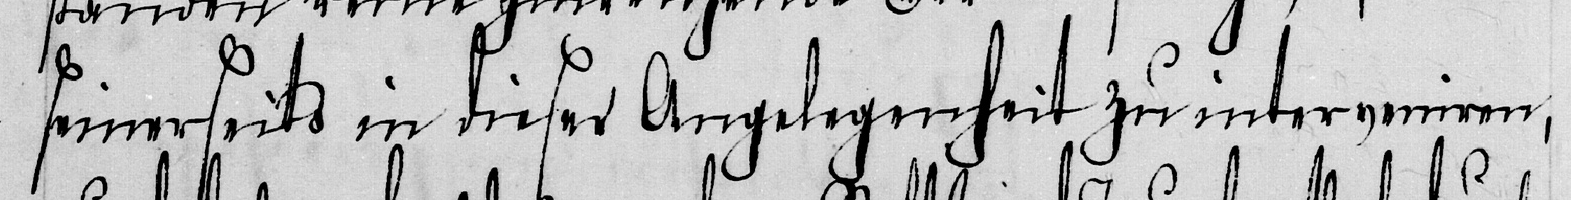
seinerseits in dieser Angelegenheit zu interveniren,
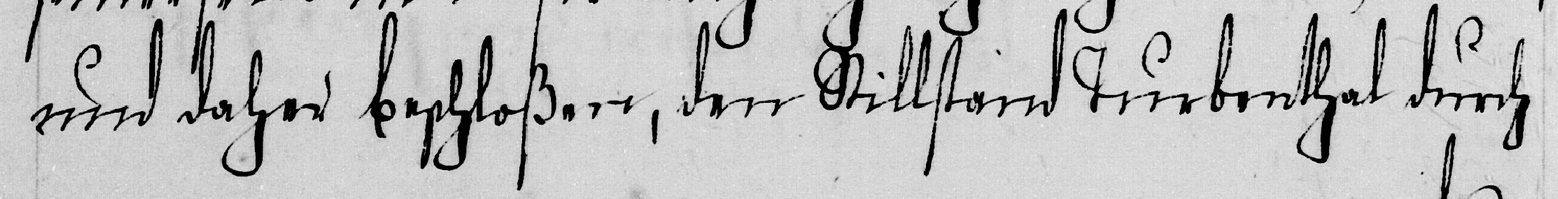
und daher beschloßen, den Stillstand Turbenthal durch
